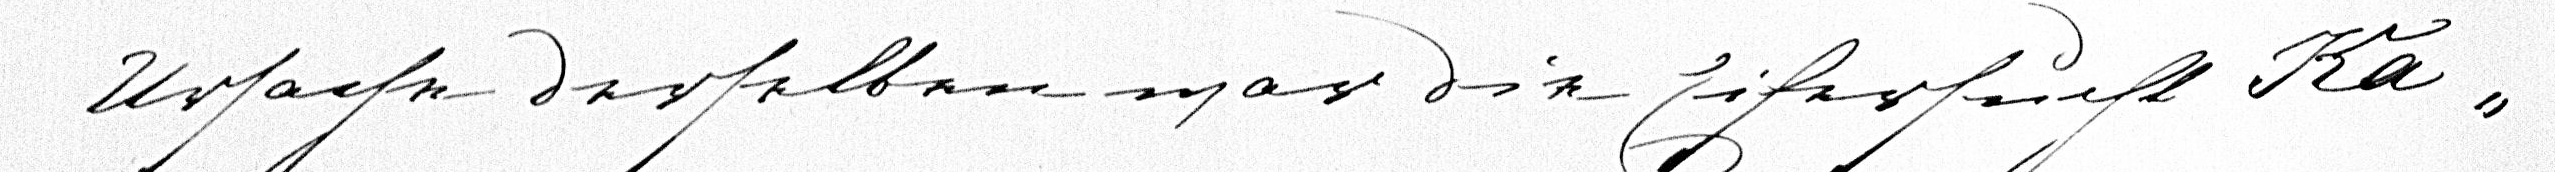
Ursache derselben war die Eifersucht Ka¬
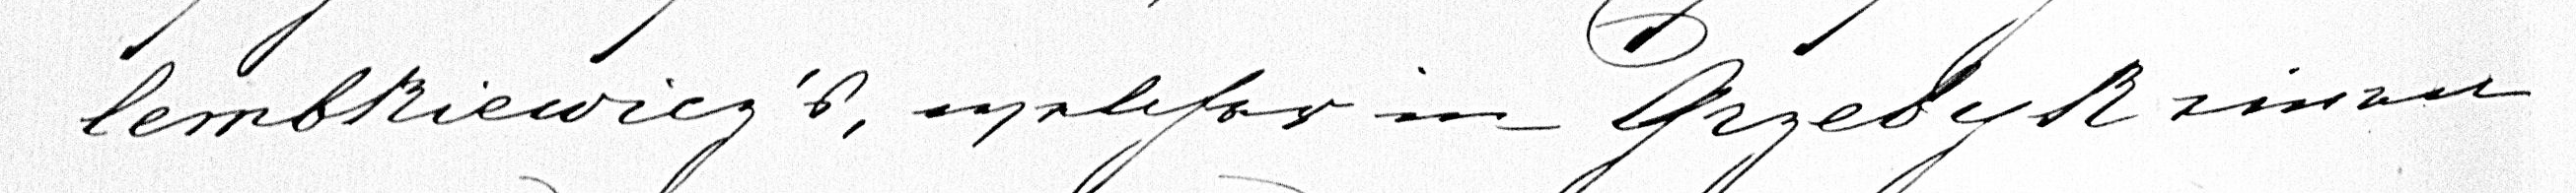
lembkiewicz’s, welcher in Grzebyk einen
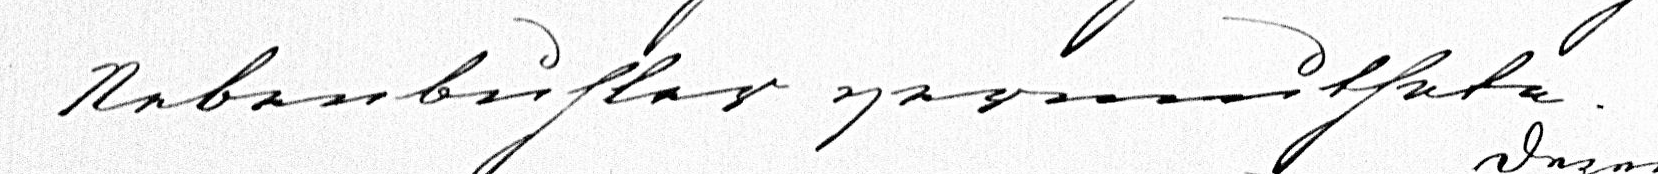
Rebenbuhler vermuthete.
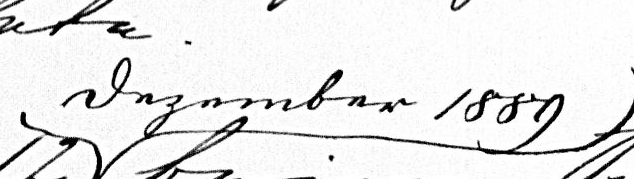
Dezember 1889
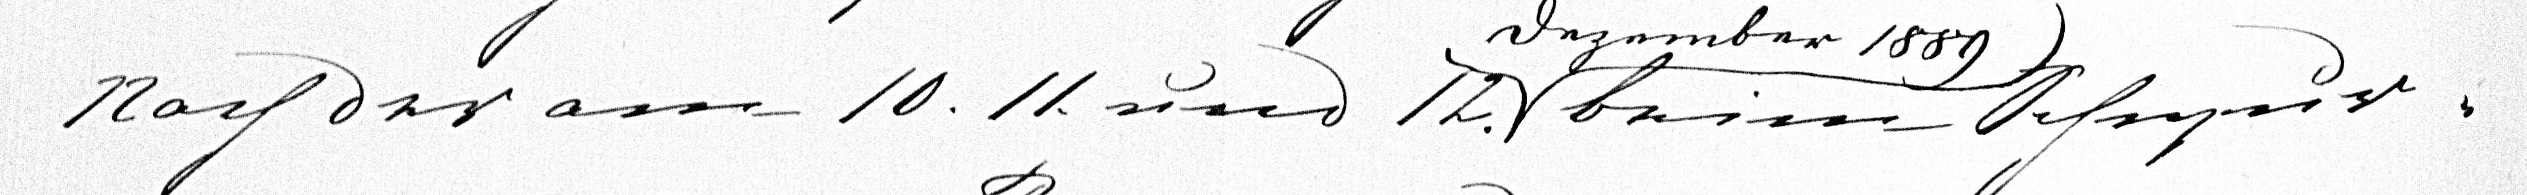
Nach der am 10. 11. und 12. beim Schwur¬
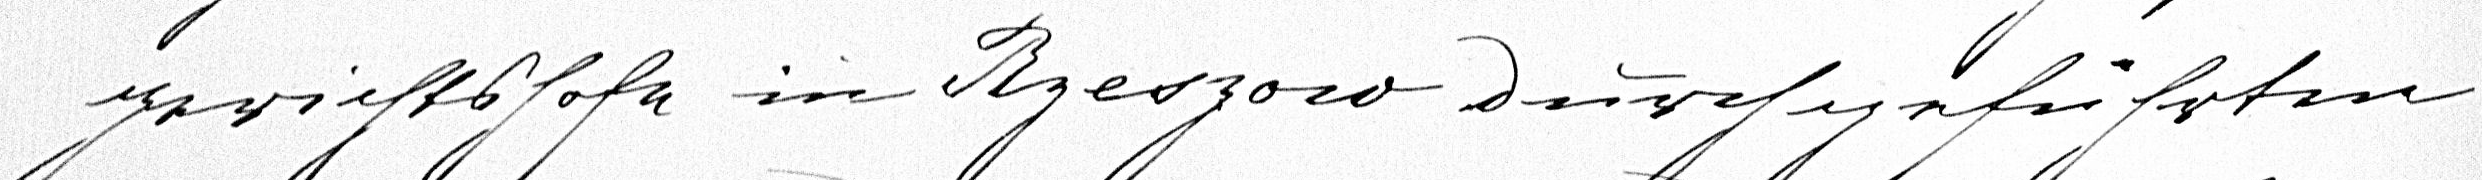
gerichtssohn in Rzeszow durch geführten
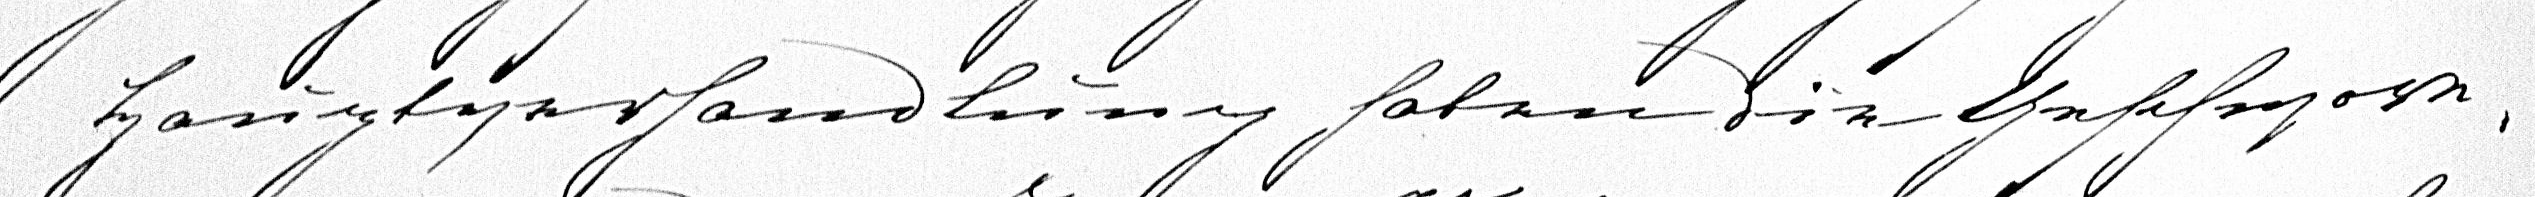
Hauptverhandlung haben die Geschwor¬
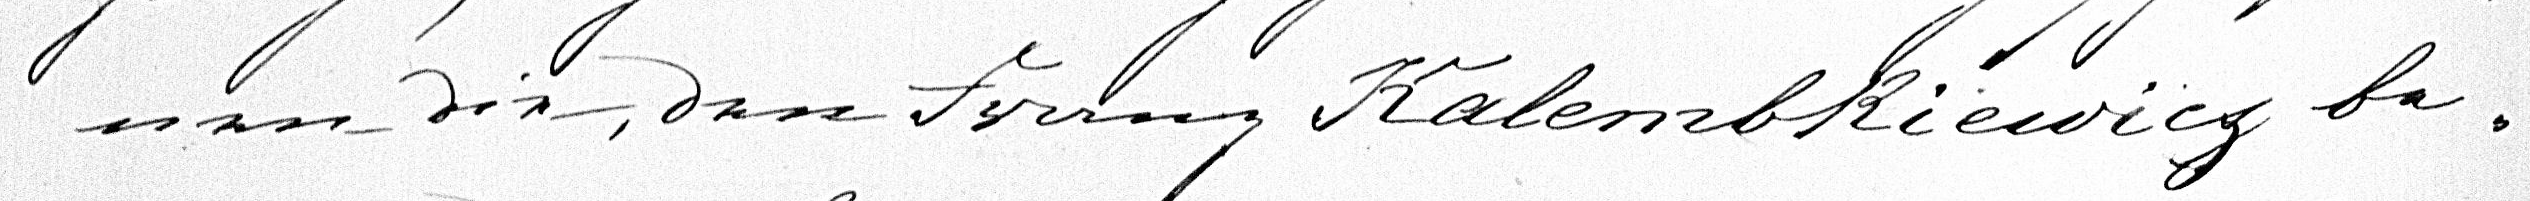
nen die, den Franz Kalembkiewicz be¬
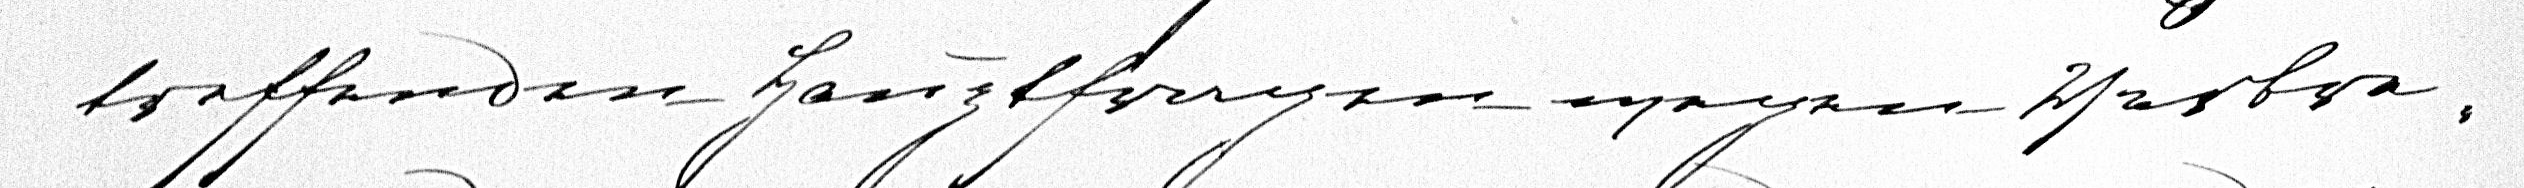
treffenden Hauptfragen wegen Verbre¬
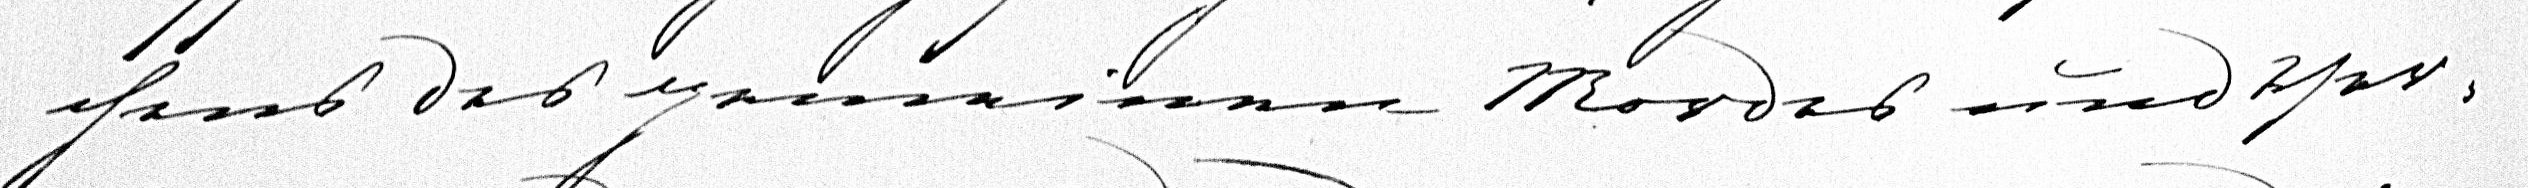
chens des gemeinen Mordes und Ver¬
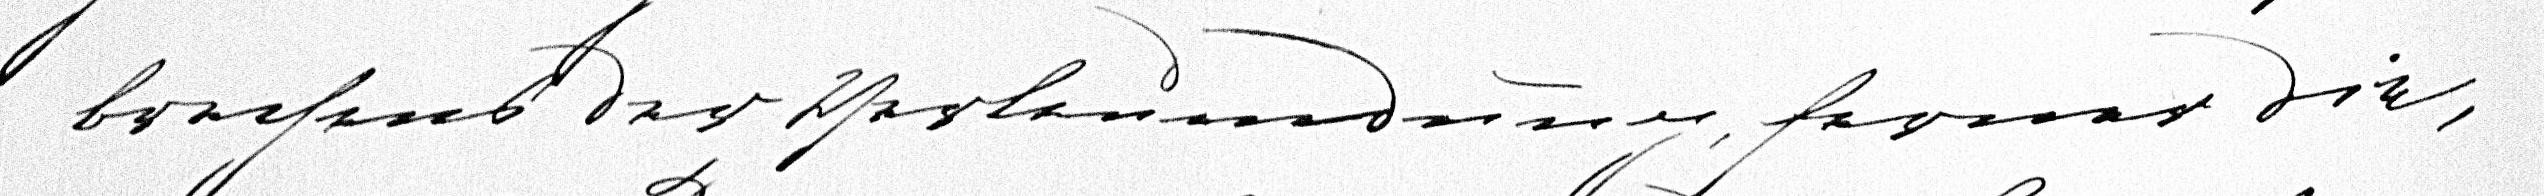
brechens der Verleumdung, fermer die,
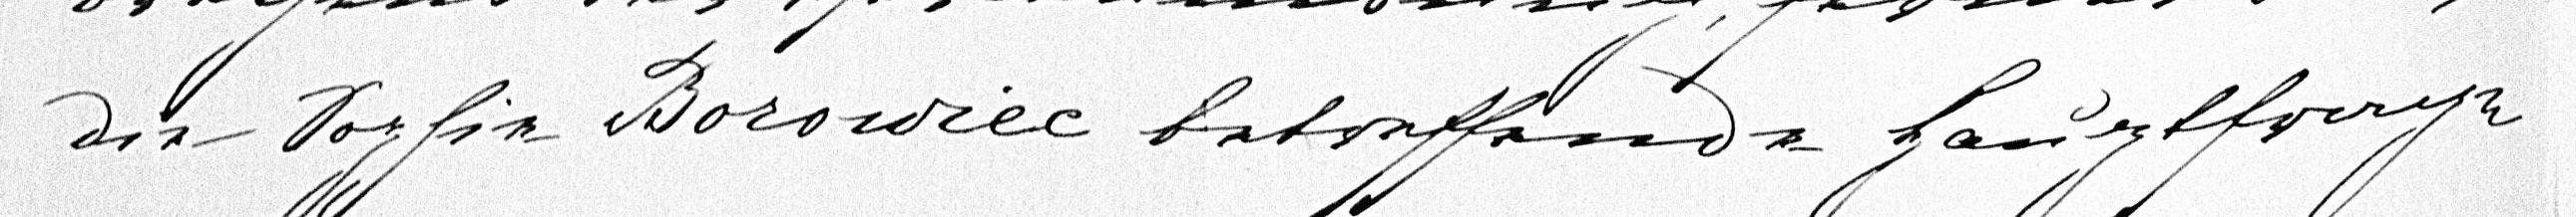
die Sophie Borowiec betreffende Hauptfrag¬
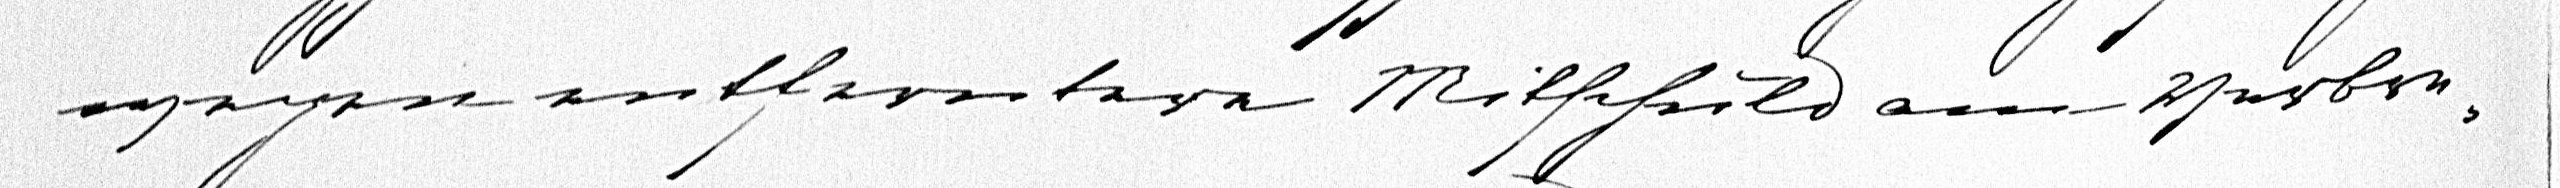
wegen entferntere Mitschuld am verbre¬
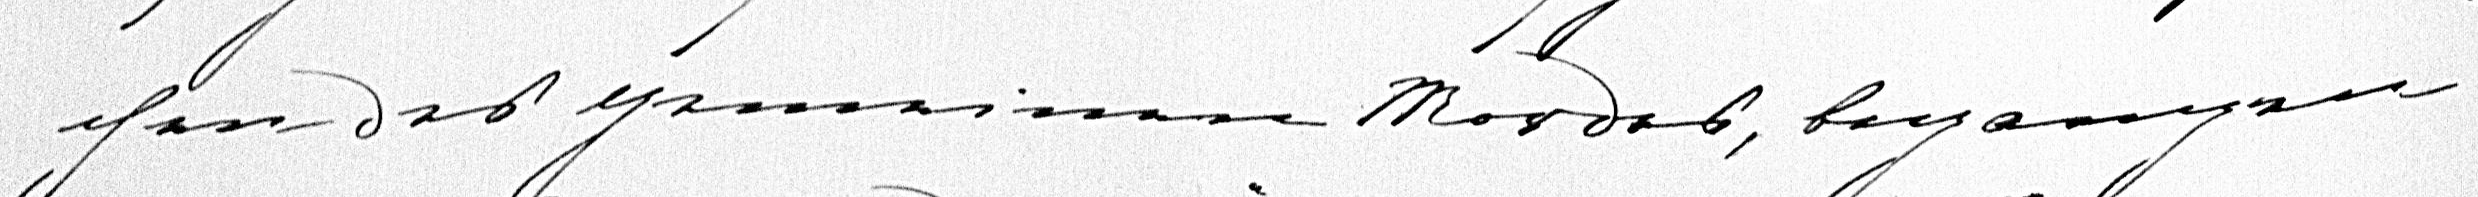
chen des gemeinen Mordes, begangen
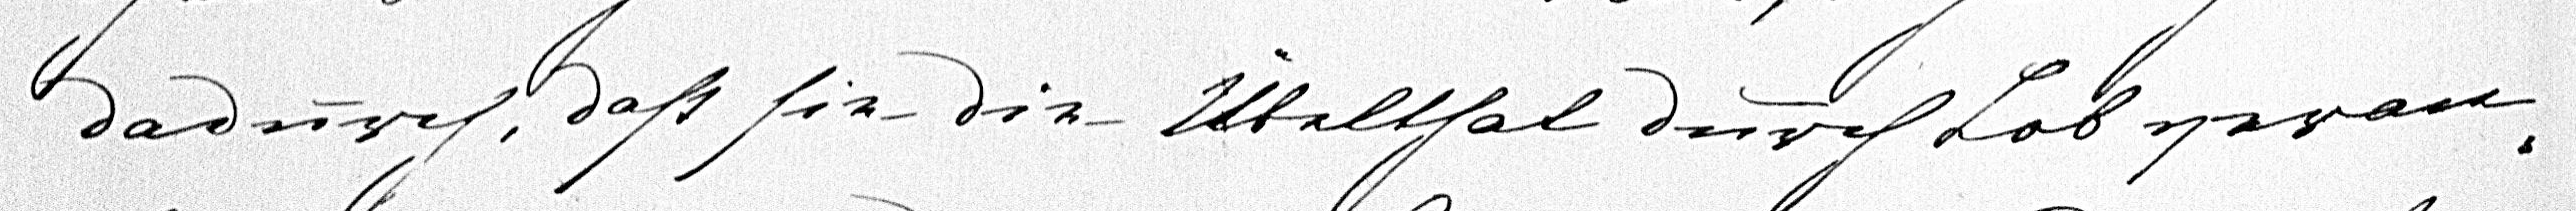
dadurch, daß sie die Übelthat durch Los veran¬
